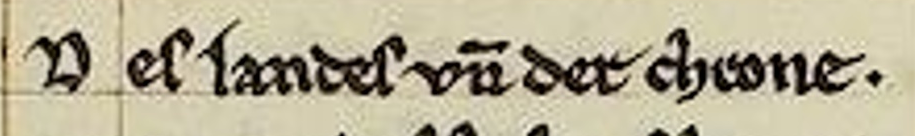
Deſ landeſ vn(d) der chrone.
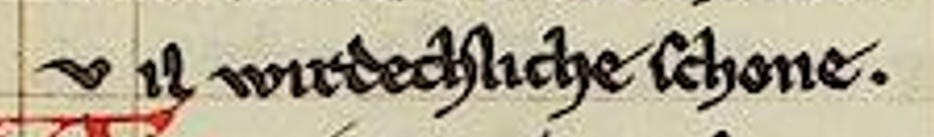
Vil wirdechliche ſchone.
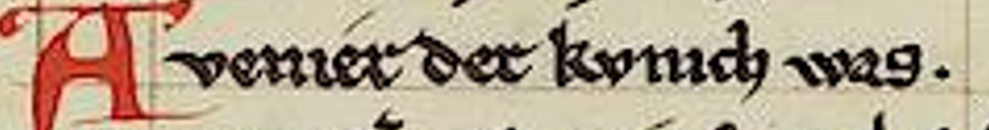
*Avenier der kvnich was.
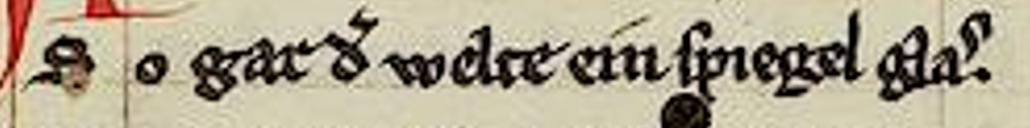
So gar d(er) welte ein ſpiegel gla°(ſ).
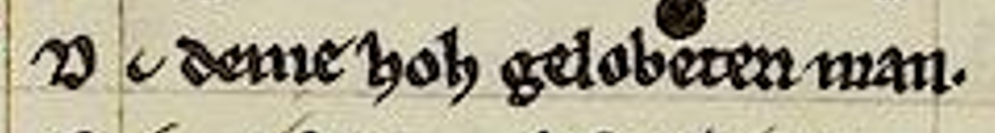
D(az) deme hoh gelobeten man.
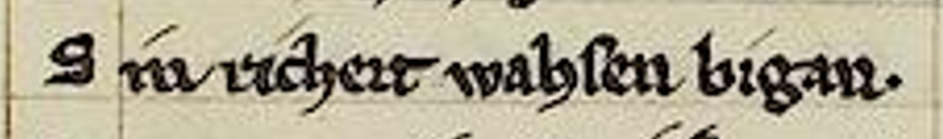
Sin richeit wahſen bigan.
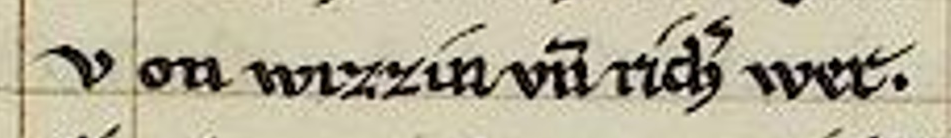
Von wizzin vn(d) rich(er) wer.
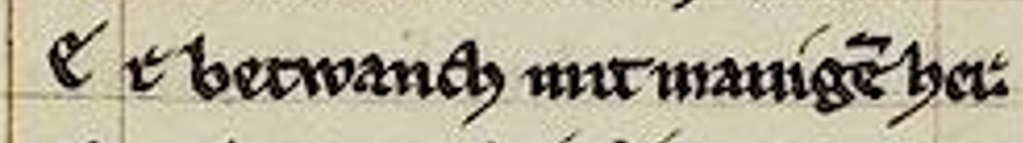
Er betwanch mit manige(m) her.
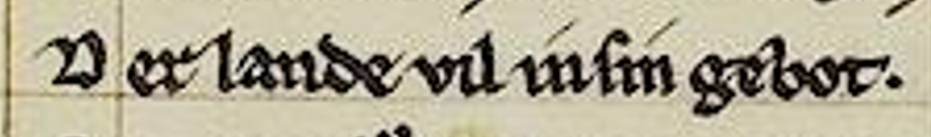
Der lande vil in ſin gebot.
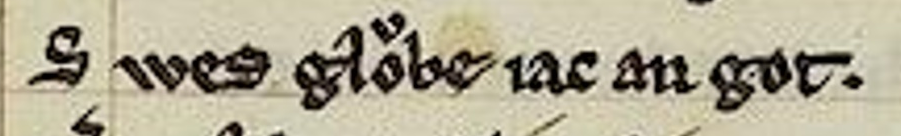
Swes glo°vbe iac an got.
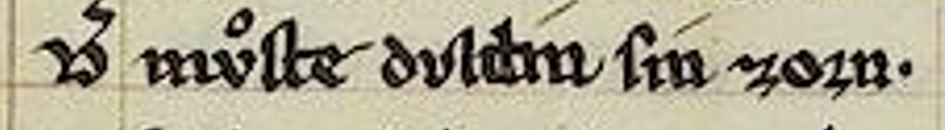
D(er) mv°oſte dvldin ſin zorn.
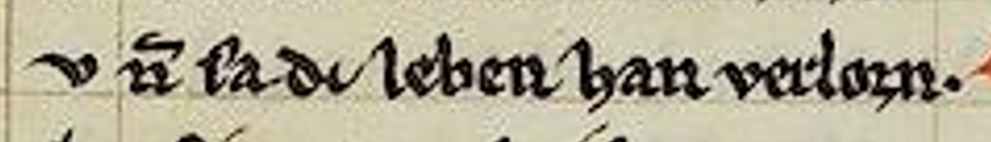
Vn(d) ſa d(az) leben han verlorn.
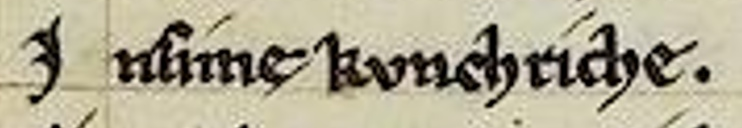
Inſime kvnchriche.
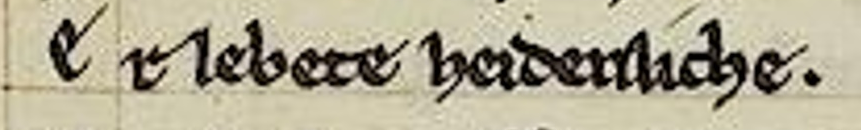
Er lebete heidenliche.
